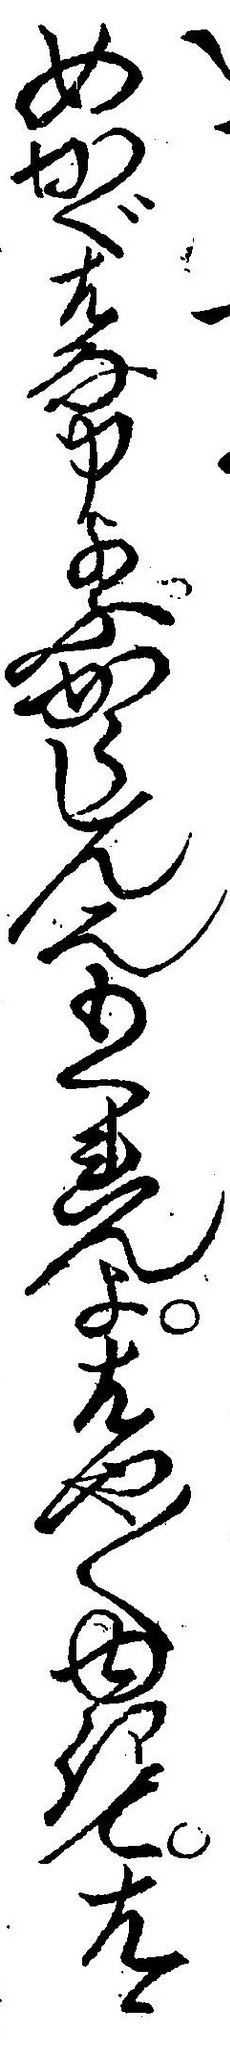かぐはな申よふ。かうしん也もくれんよ。はや〳〵ゆきて。はゝ
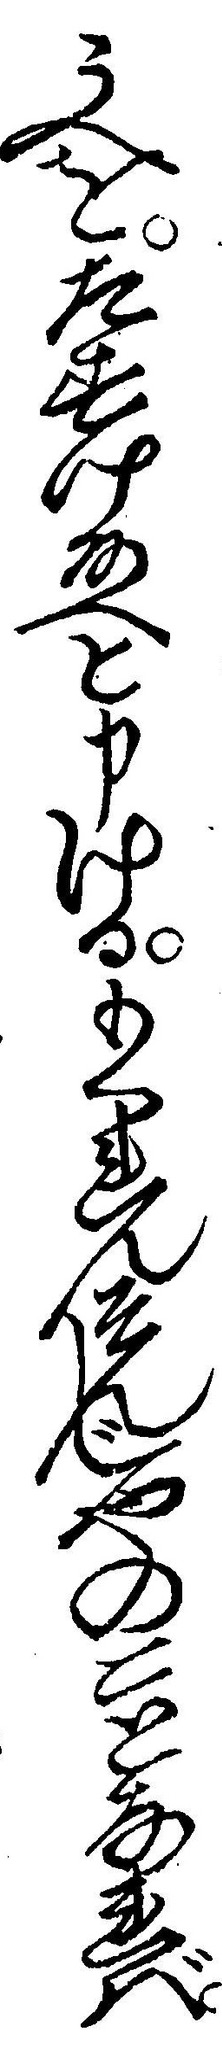うへを。たすけ給へと申ける。もくれんそんじやのことなれば。
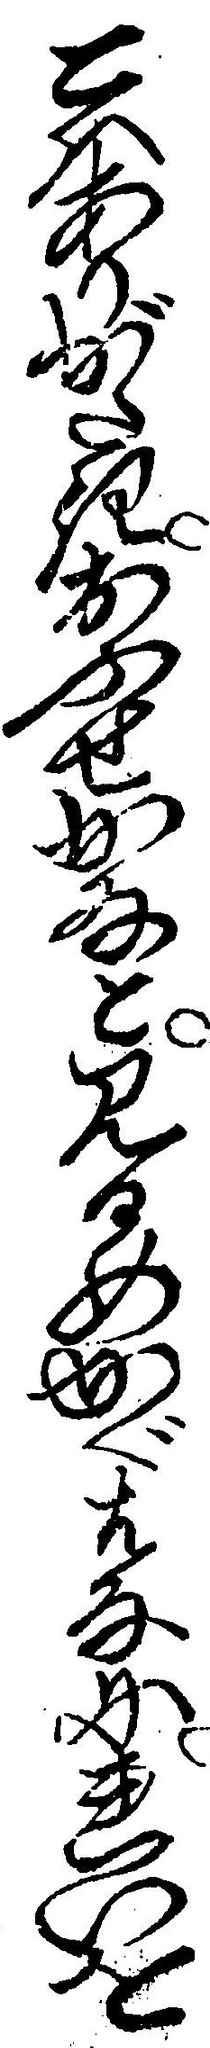こはありがたき。おふせかなと。見るめかぐはな。れいを
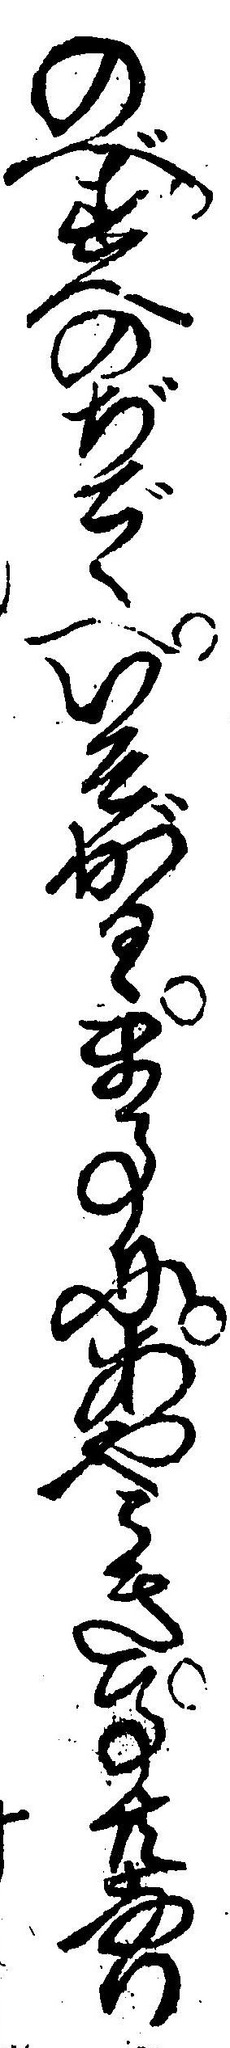のべすへのぢごくへ。いそがるゝ。ま事に。あやうき。事共なり

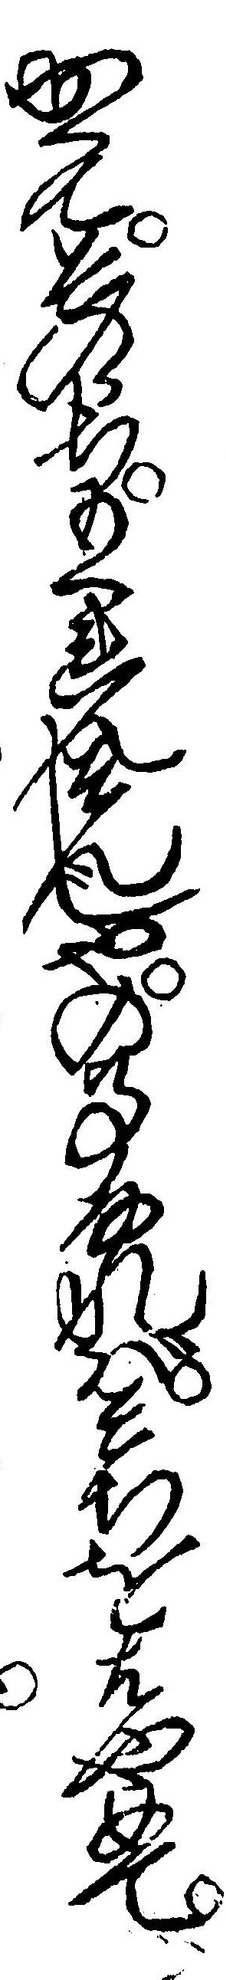かくて。そのゝち。もくれんそんじや。の事なれば。みちをはやめて。
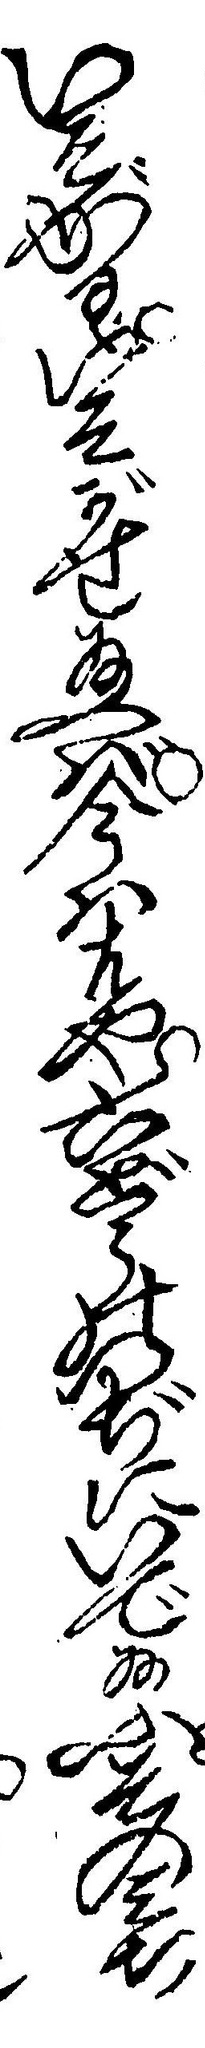いそがるゝ。いそがせ給へば。今ははや。六どうのつぢにいで給ふ。そのみち
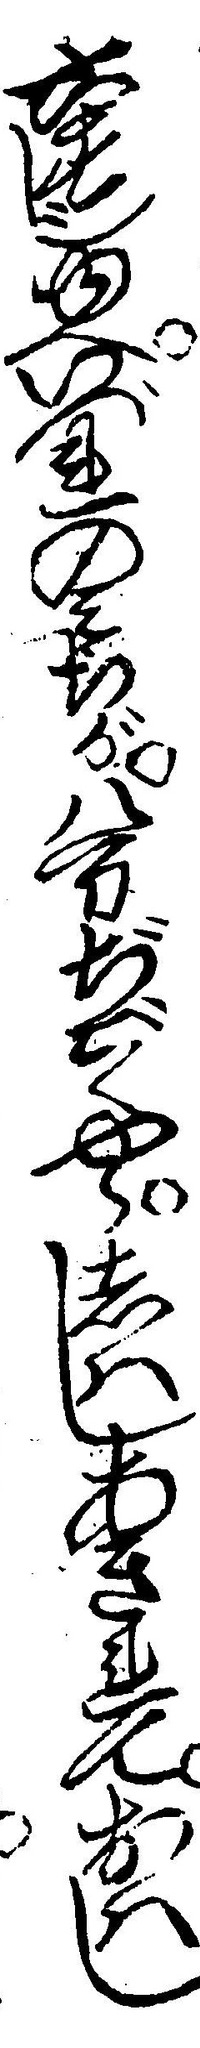六すじゆへ。いづれのみちが。八万ぢごくやら。しはしあきれて。おはし
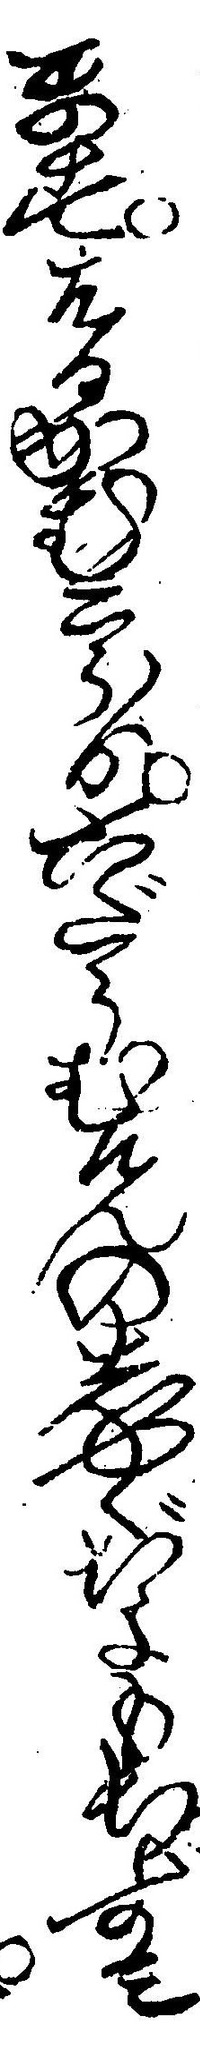ます。はるかむこうゟ。六だうむけんのしやくぢよもち。すみ
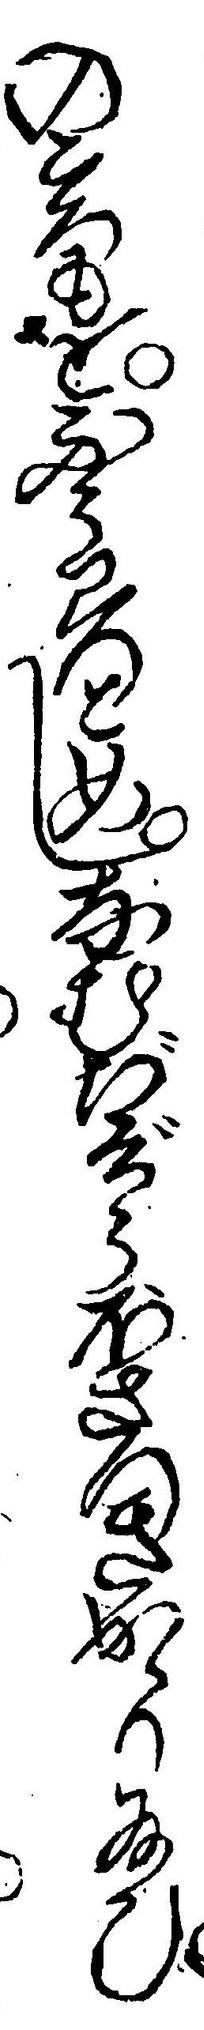のころもを。ふうわつとめし。なむぢぞうぼさつきかゝり給ひ。
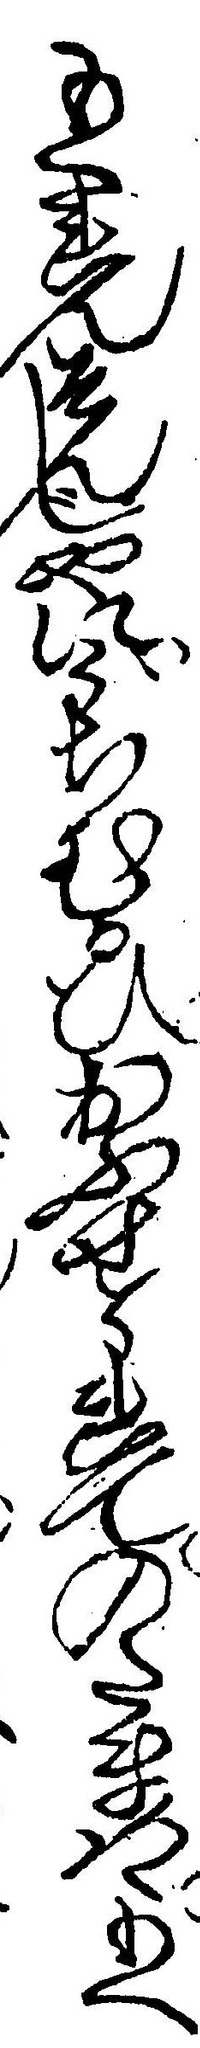もくれんそんじやに。うちむかひ。おふせられて。のたまはく。もく
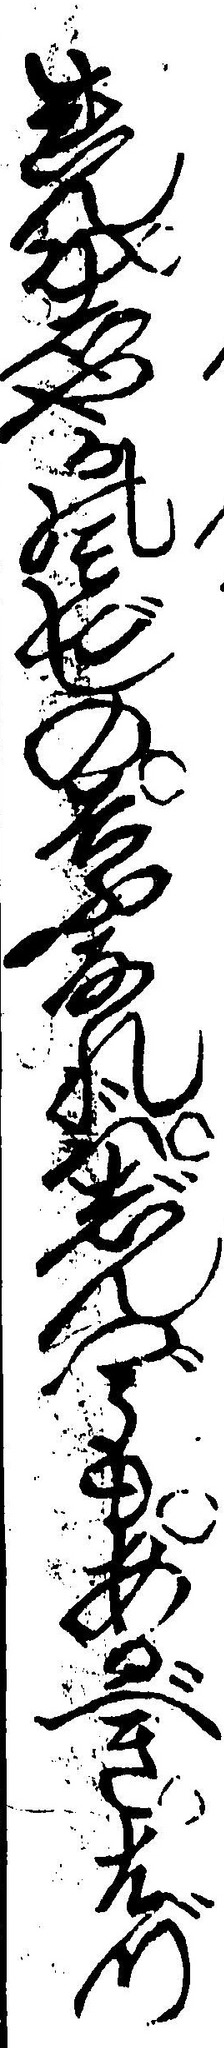れんはしやかのみでしの。そふなれば。じんづうも。あるべき。はづ
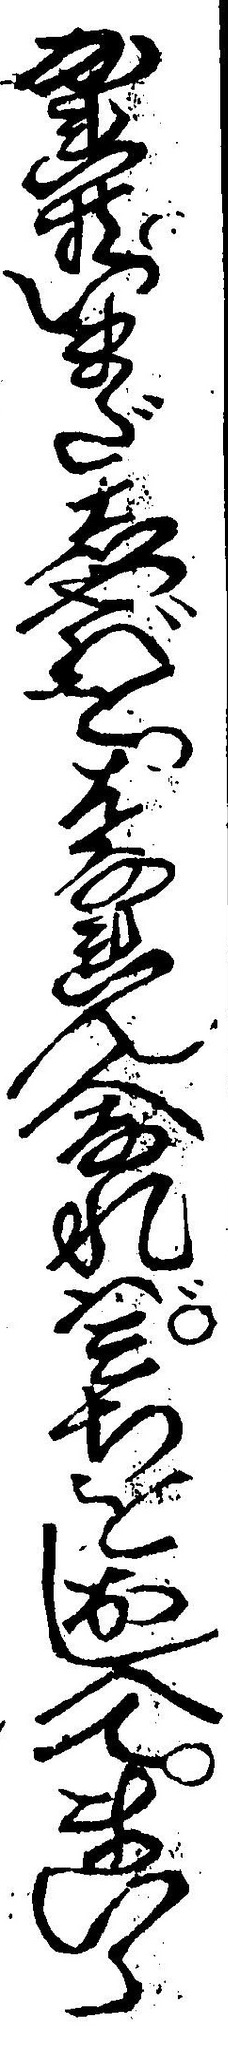なれ共。いまだしやばを。はなれん人なれば。みちをおしへて。まいら
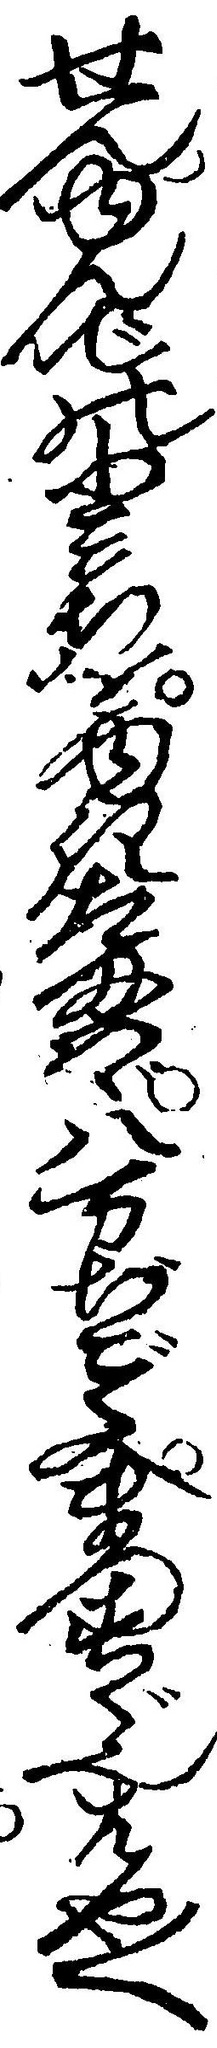せん。ゆんでの小みちを。ゆきたまはゞ。八万ぢごくへ。まつすぐ也はやく
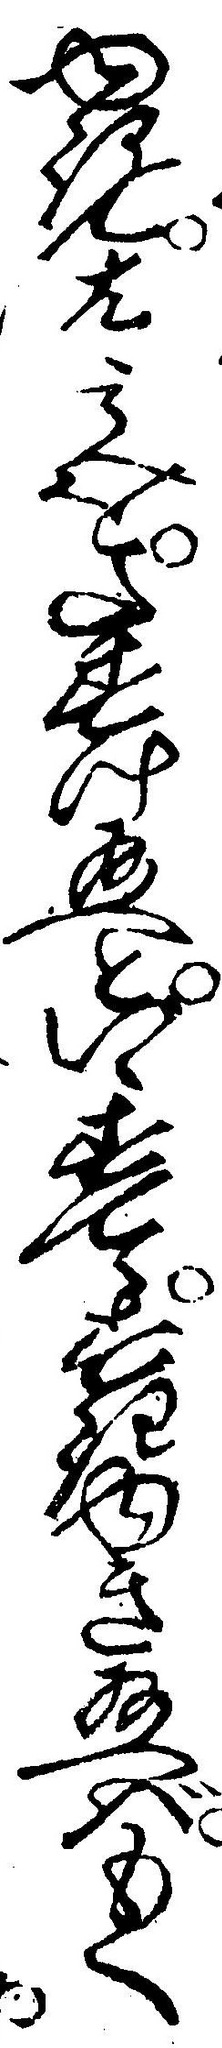ゆきて。はゝうへを。たすけ給へと。いゝすてゝ。すきゆき給へば。もく
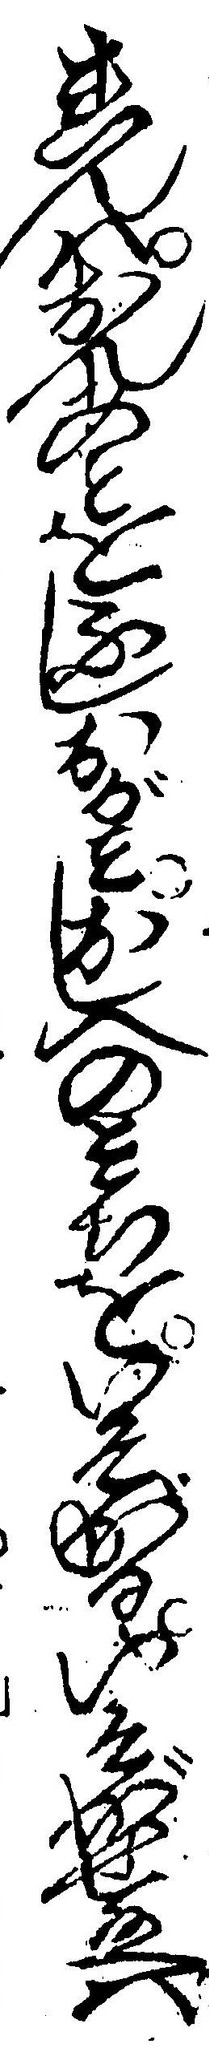れんは。おんあとをふしおがみ。おしへのみちを。いそがるゝ。いそがせ給へは。
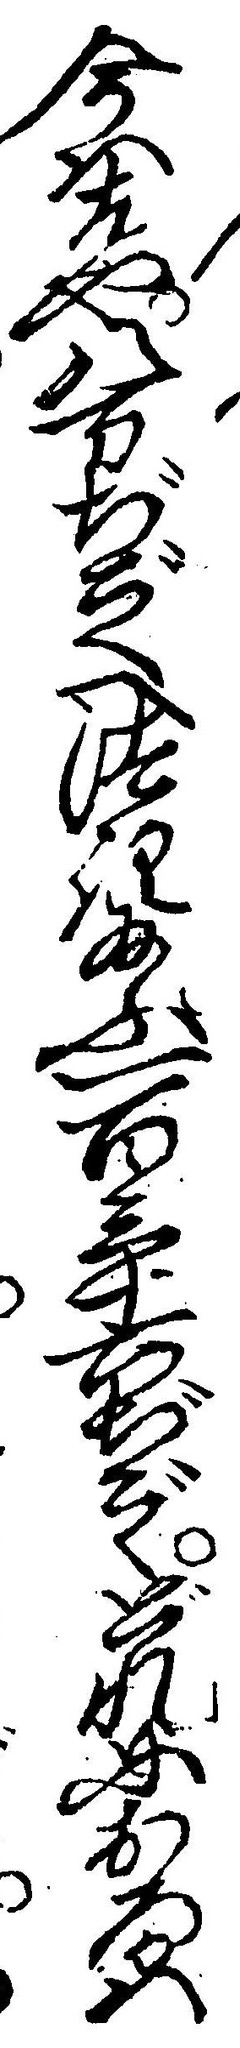今ははや。八万ぢごくへつき給ふ一百三十六ぢごく。どれにおろかは
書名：目連尊者地獄めくり / 宇留藤太夫正本
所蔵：東京大学総合図書館 General Library in the University of Tokyo, JAPAN
